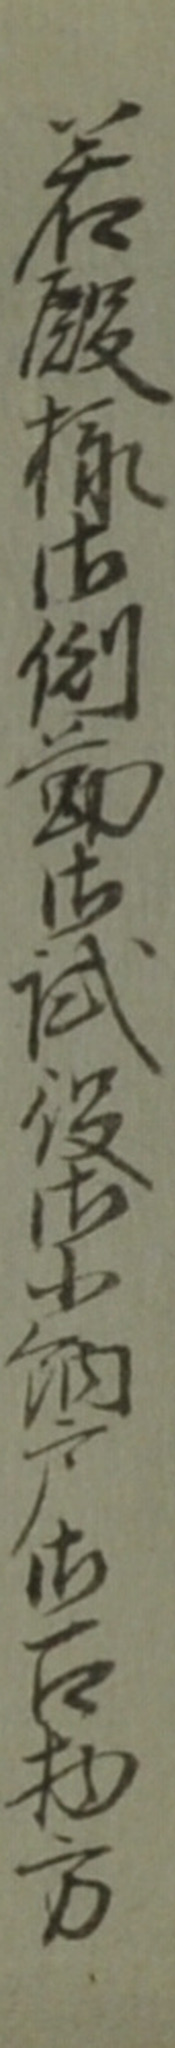若殿様御側勤御試役御小納戸御召物方
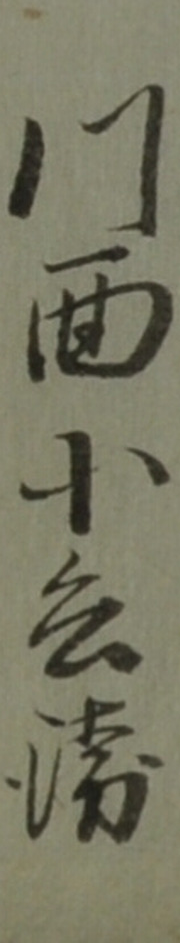川西小兵衛
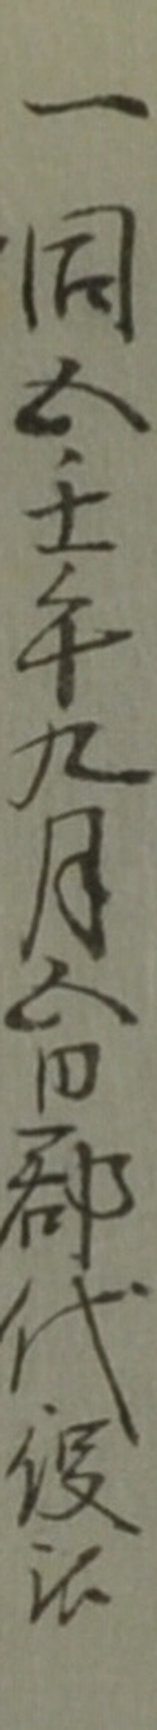一同五壬午九月五日郡代役被
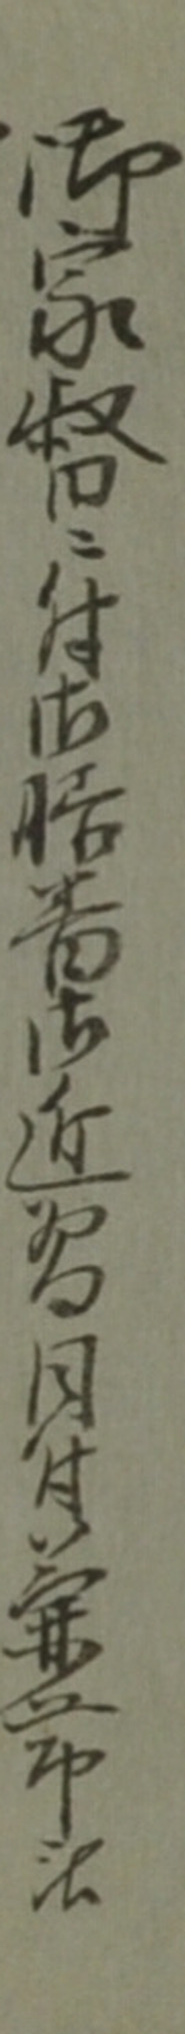御家督ニ付御膳番御近習目付兼帯被
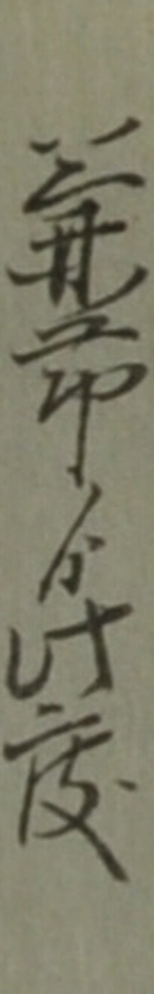兼帯ゟ此度
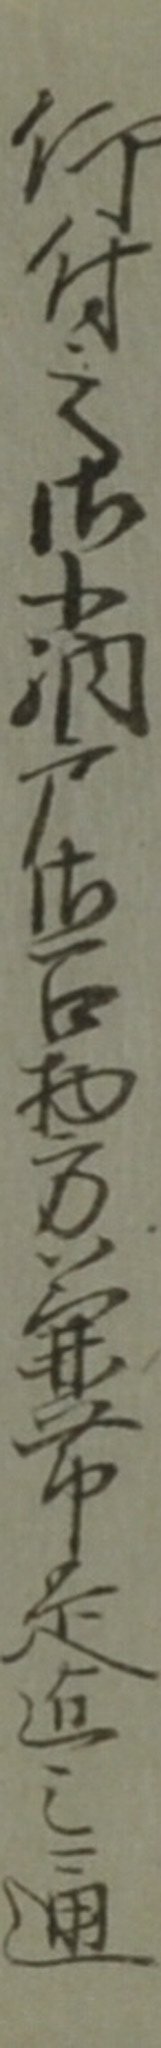御付之御小納戸御召物方兼帯之通
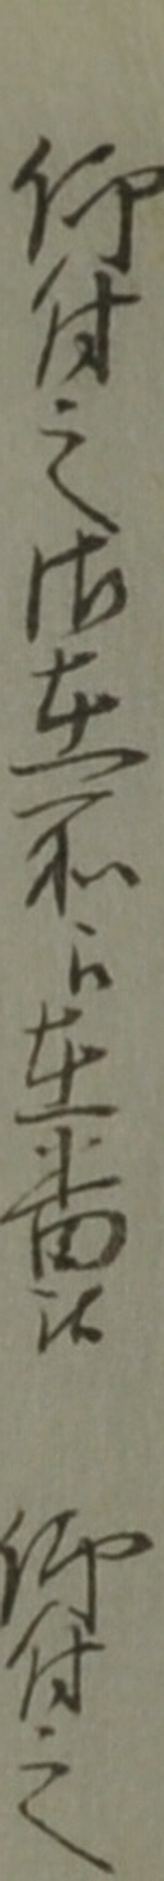仰付之御在所江在番被仰付之
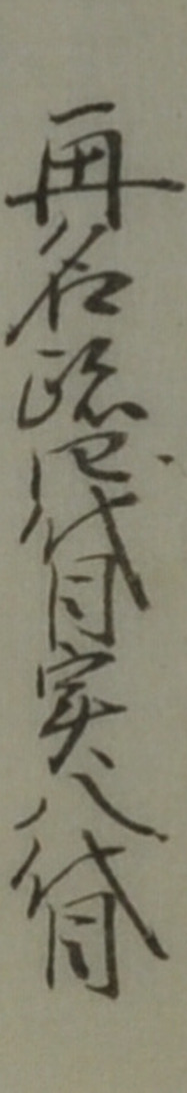再名跡四代目実八代目
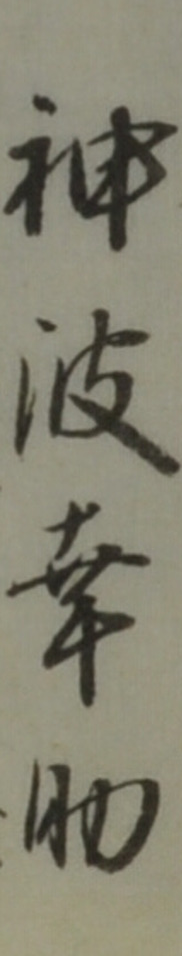神波幸助
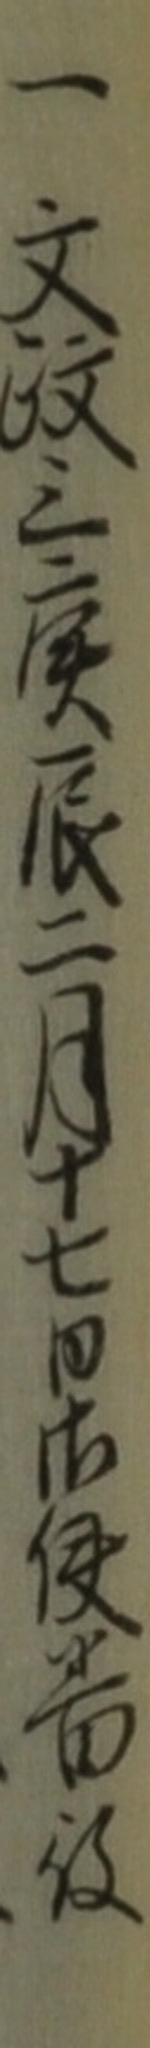一文政三庚辰二月十七日御使番役
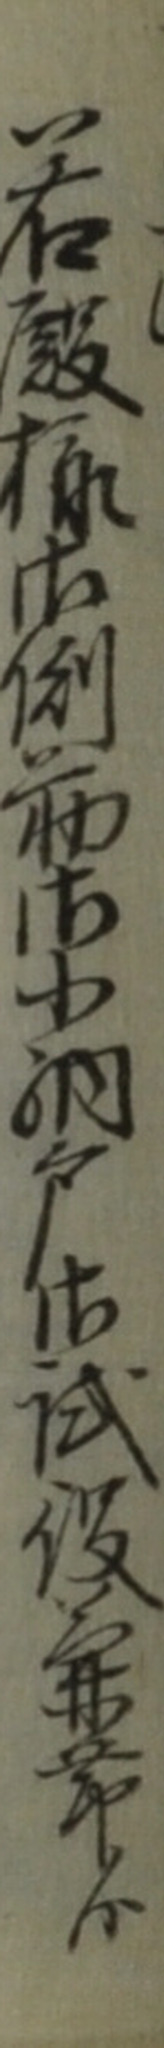若殿様御側勤御小納戸御試役兼帯ゟ
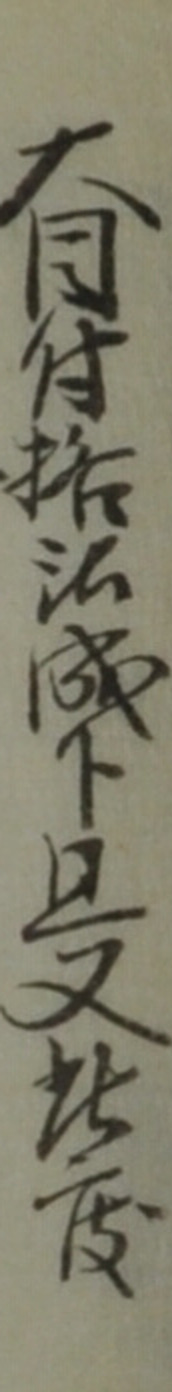大目付格被成下且又此度
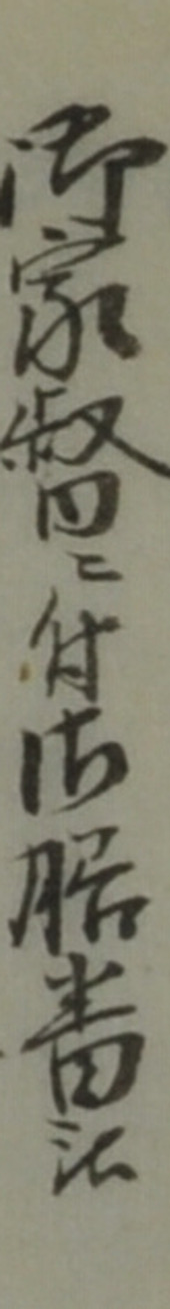御家督ニ付御膳番被
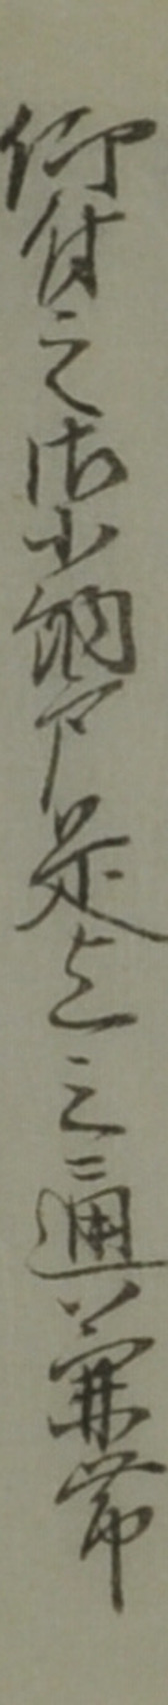仰付之御小納戸是迄之通兼帯
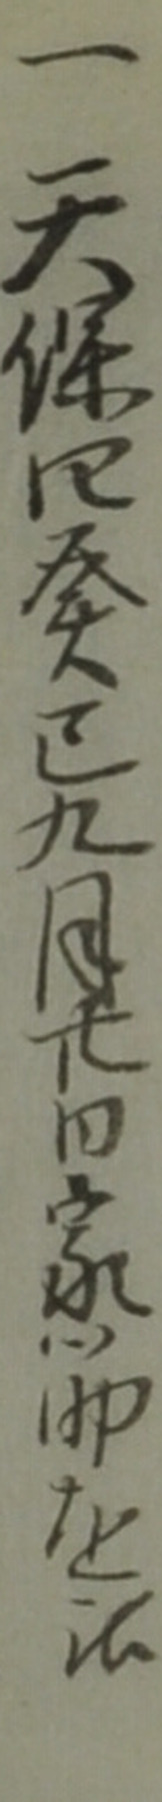一天保四癸巳九月廿日家筋を被
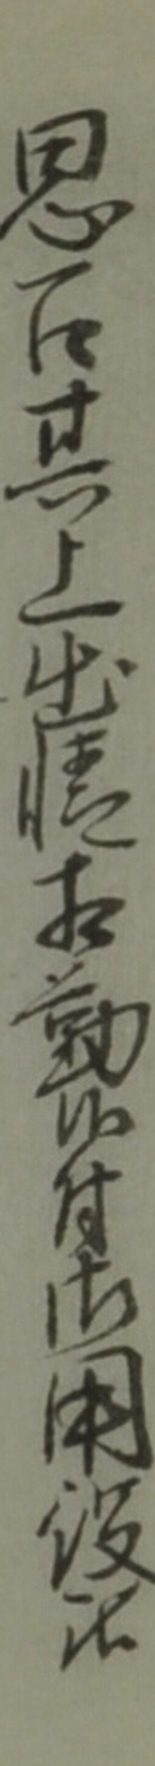思召其上出情相勤候付御用役被
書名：諸御役代々録（四）
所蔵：伊那市立高遠町図書館・合同会社AMANE
